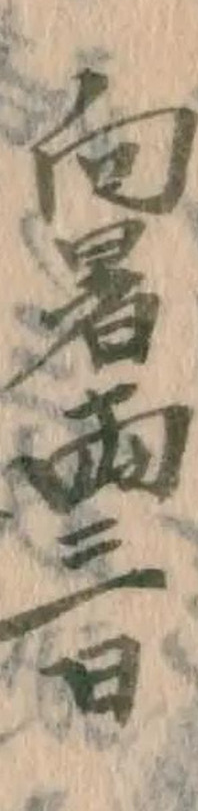向暑両三日
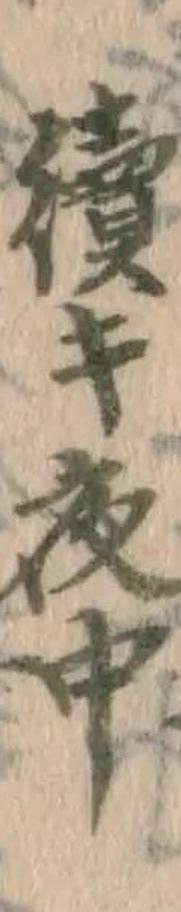続キ夜中
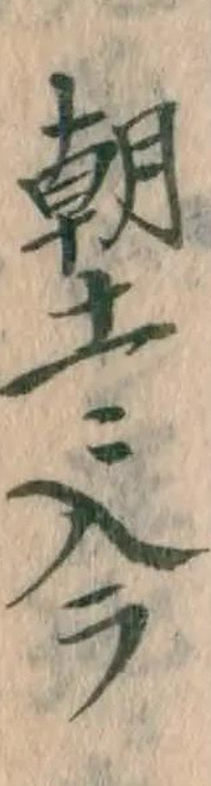朝土ニ入ラ
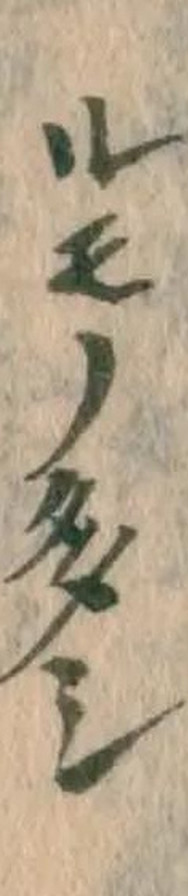ルモノ多シ
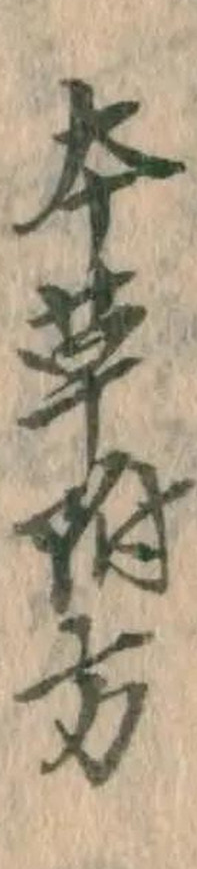本草附方
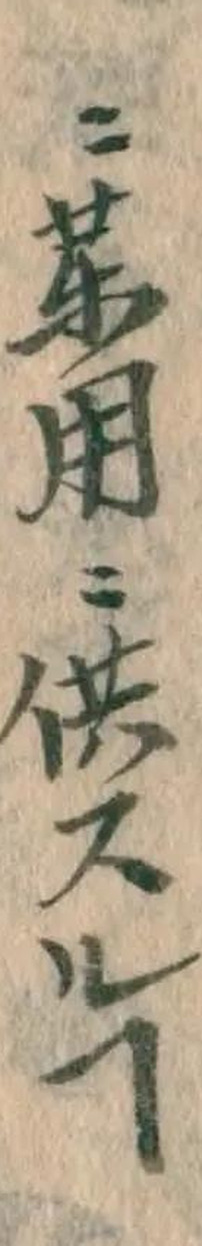ニ薬用ニ供スルコト
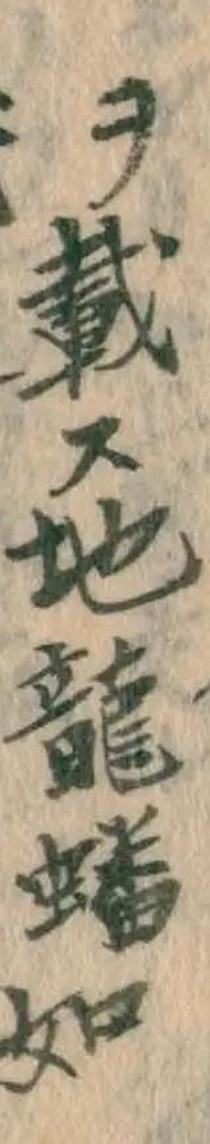ヲ載ス地龍蟠如
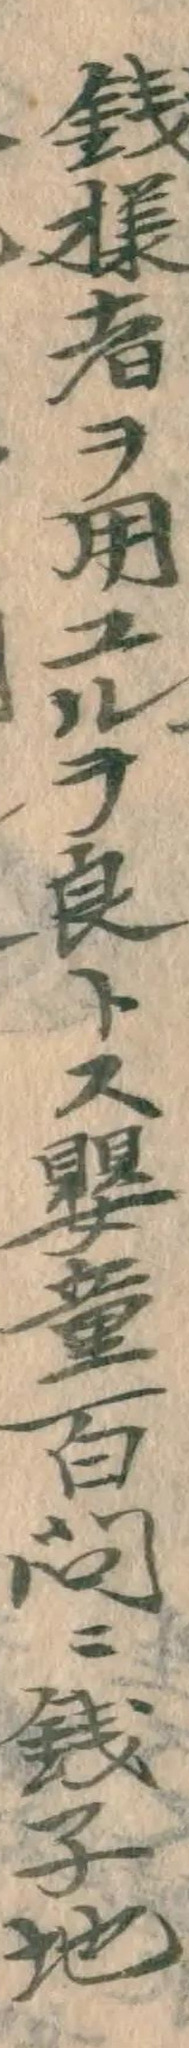銭様者ヲ用ユルヲ良トス嬰童百問ニ銭子地
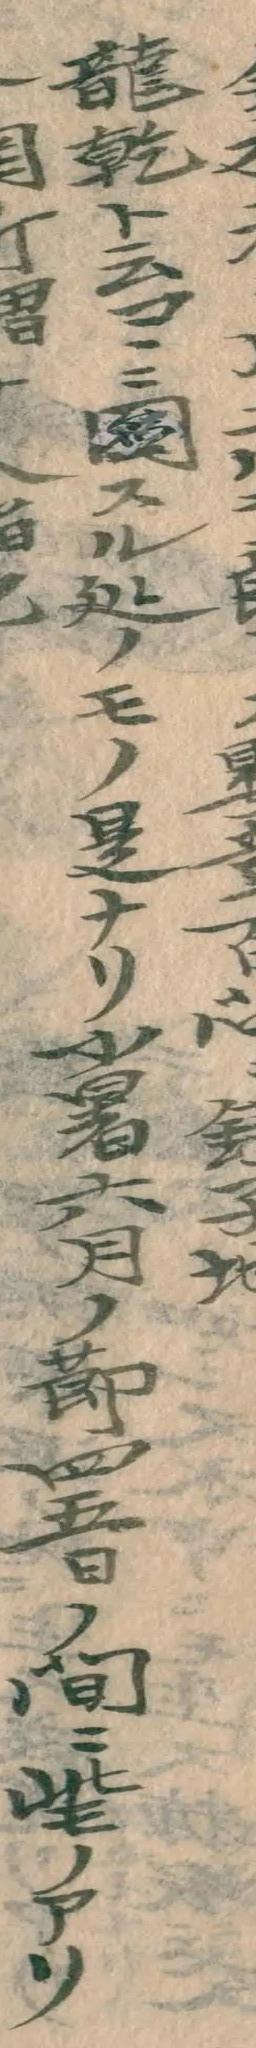龍乾ト云コヽニ図スル処ノモノ是ナリ小暑六月ノ節四五日ノ間ニ此モノアリ
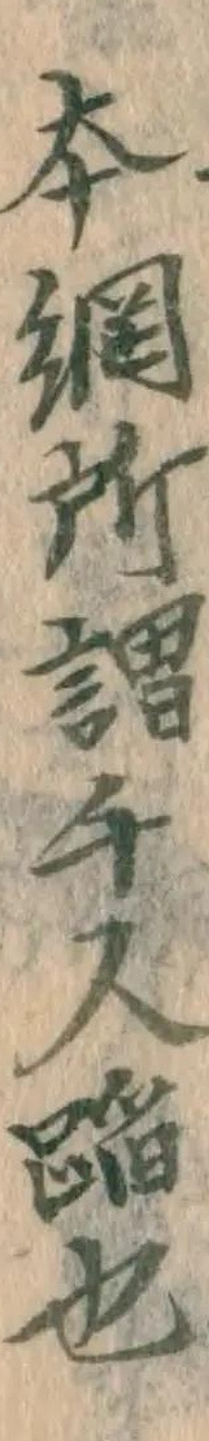本綱所謂千人蹈也

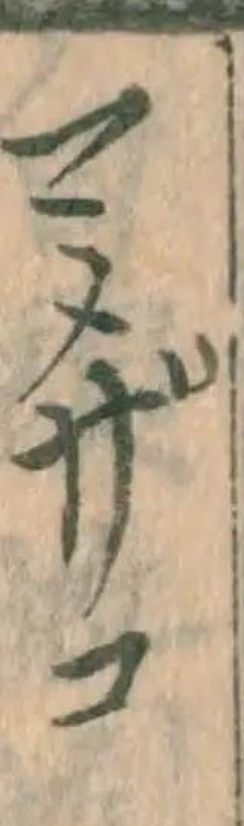マメザコ
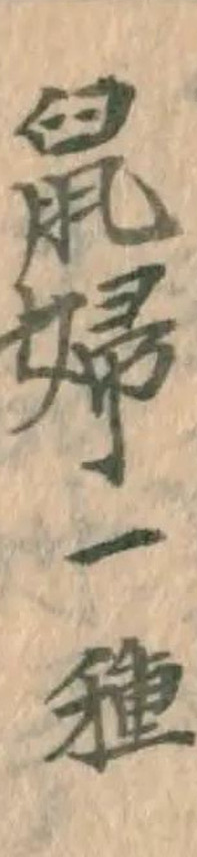鼠婦一種
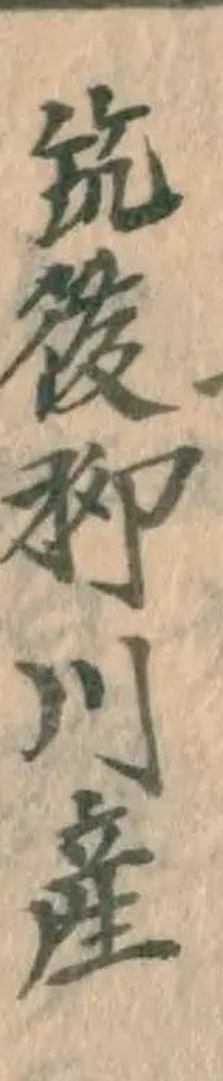筑後柳川産
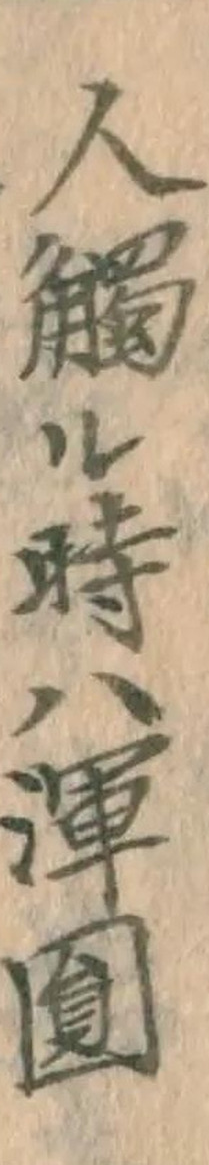人触ル時ハ渾円
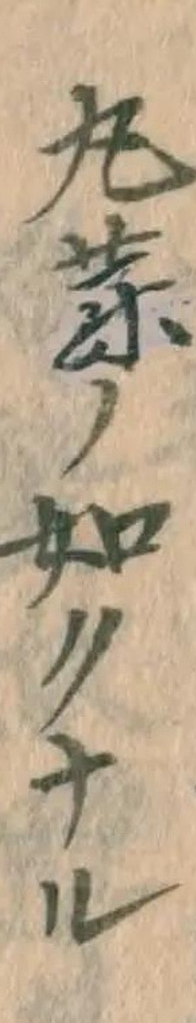丸薬ノ如クナル
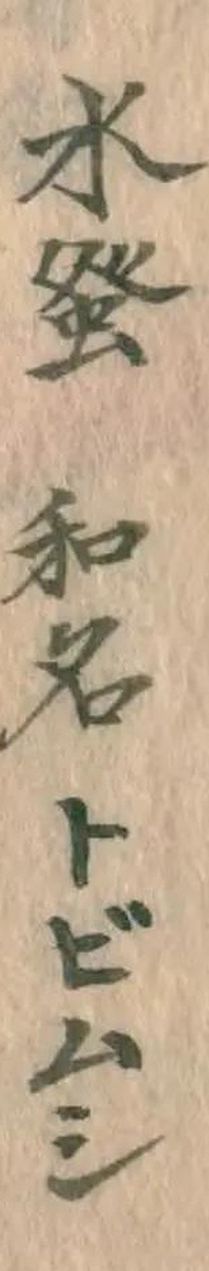水蚤和名トビムシ
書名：千蟲譜 3巻. [3]
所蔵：国立国会図書館 National Diet Library, JAPAN
